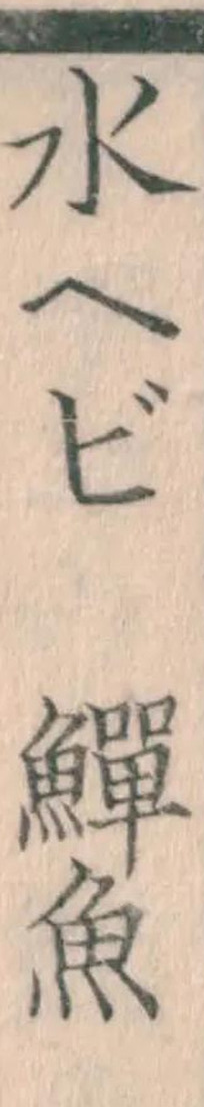水ヘビ鱓魚
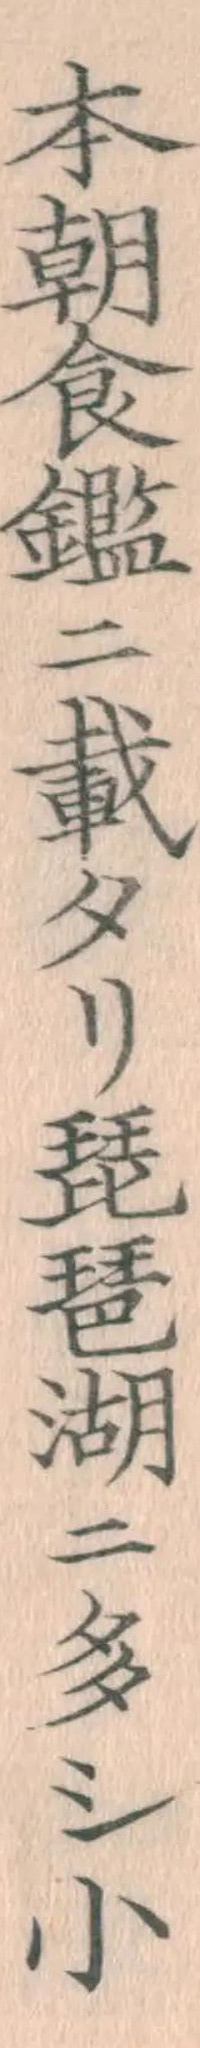本朝食鑑ニ載タリ琵琶湖ニ多シ小
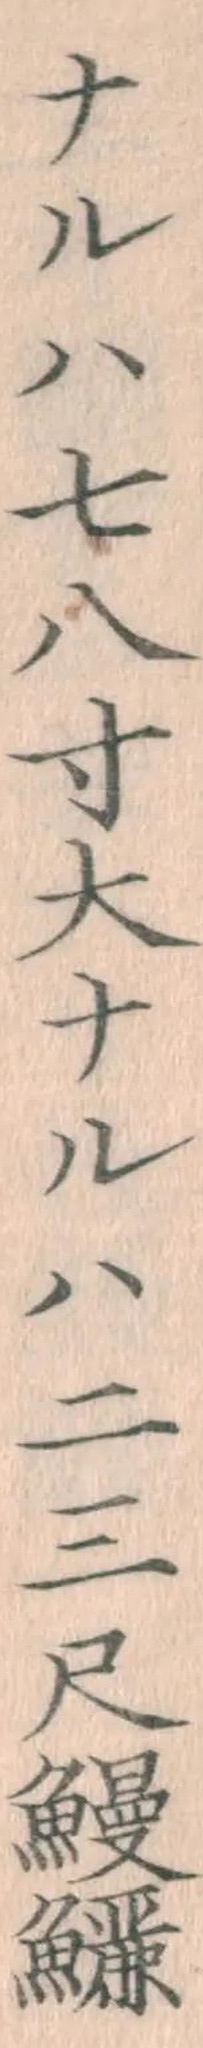ナルハ七八寸大ナルハ二三尺鰻鱺
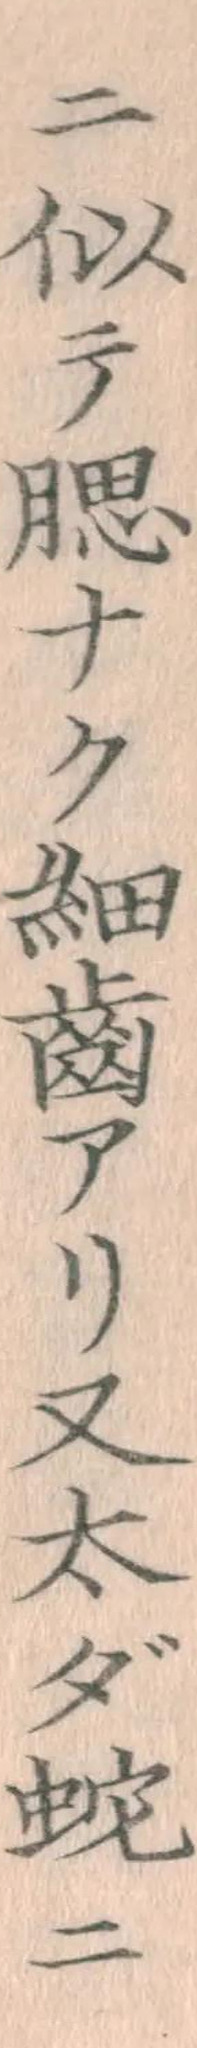ニ似テ腮ナク細歯アリ又太ダ蛇ニ
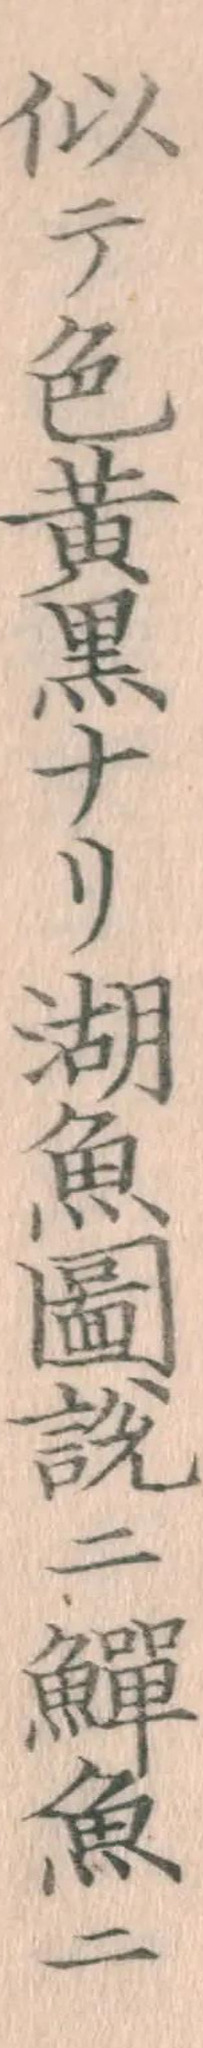似テ色黄黒ナリ湖魚図説ニ鱓魚ニ
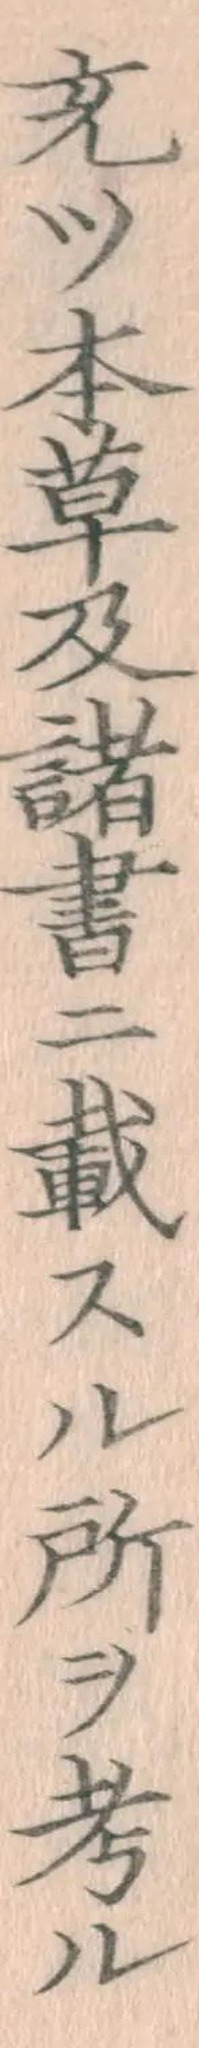充ツ本草及諸書ニ載スル所ヲ考ル
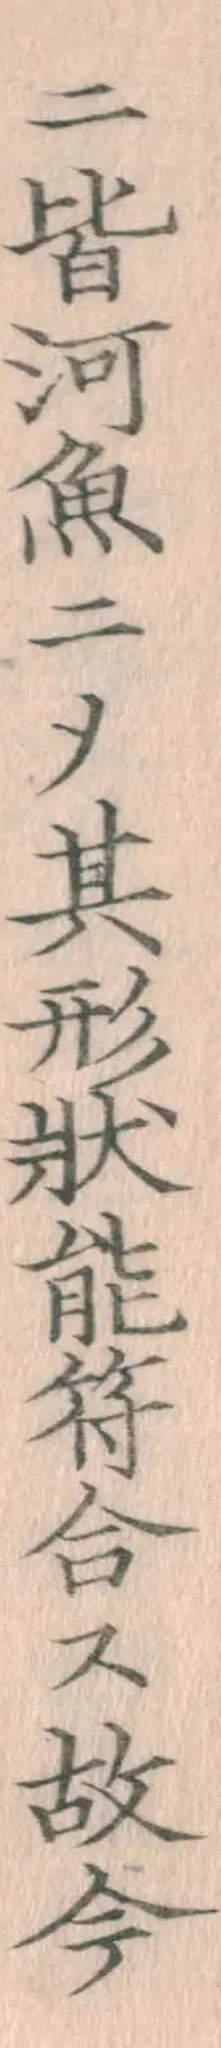ニ皆河魚ニシテ其形状能符合ス故今
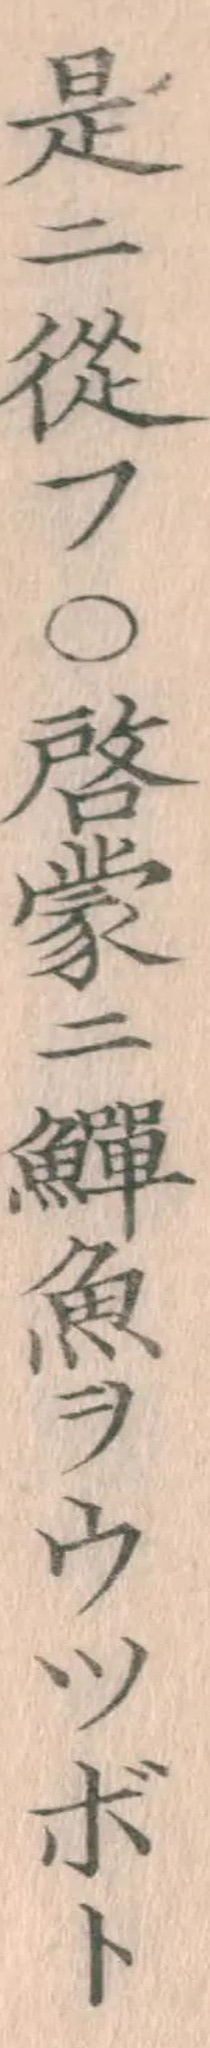是ニ従フ〇啓蒙ニ鱓魚ヲウツボト
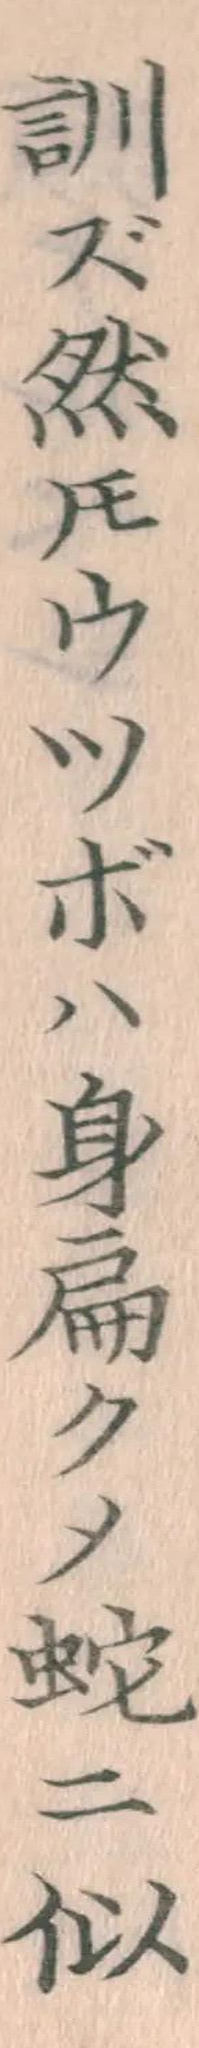訓ズ然トモウツボハ身扁クシテ蛇ニ似
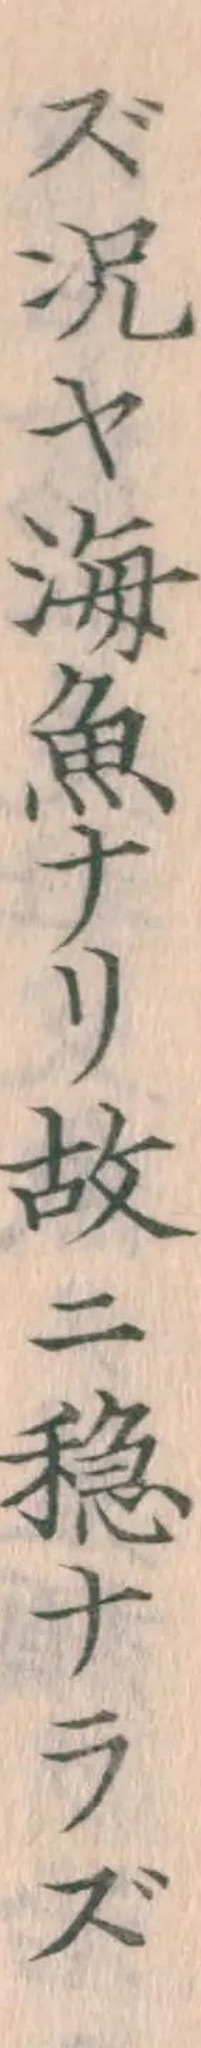ズ況ヤ海魚ナリ故ニ穏ナラズ
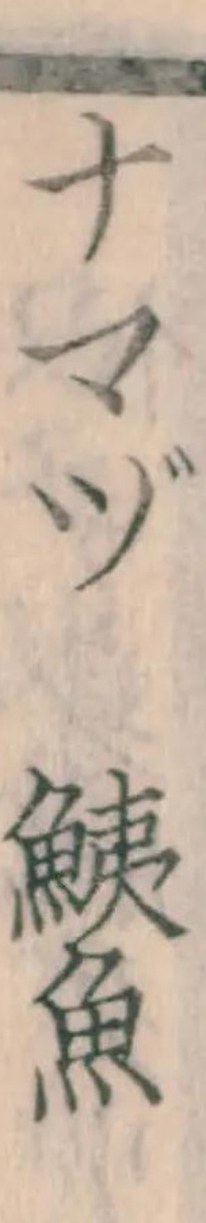ナマヅ鮧魚
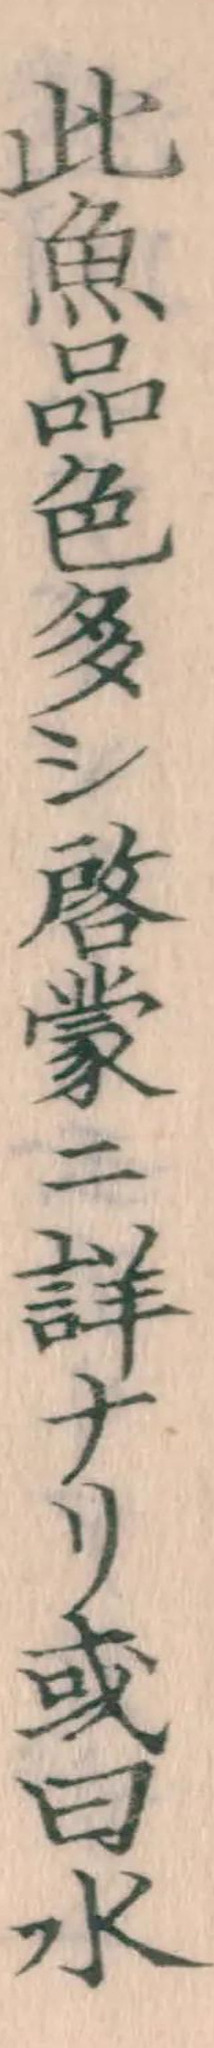此魚品色多シ啓蒙ニ詳ナリ或曰水
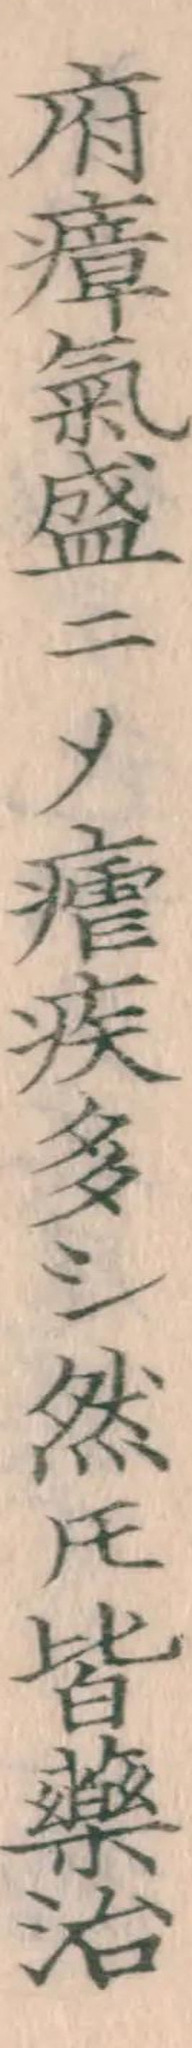府瘴気盛ニシテ癨疾多シ然トモ皆薬治
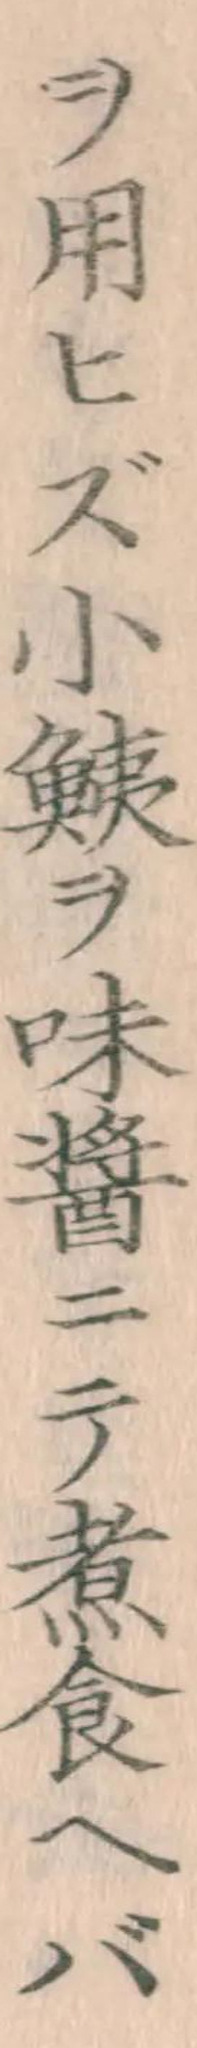ヲ用ヒズ小鮧ヲ味醬ニテ煮食ヘバ
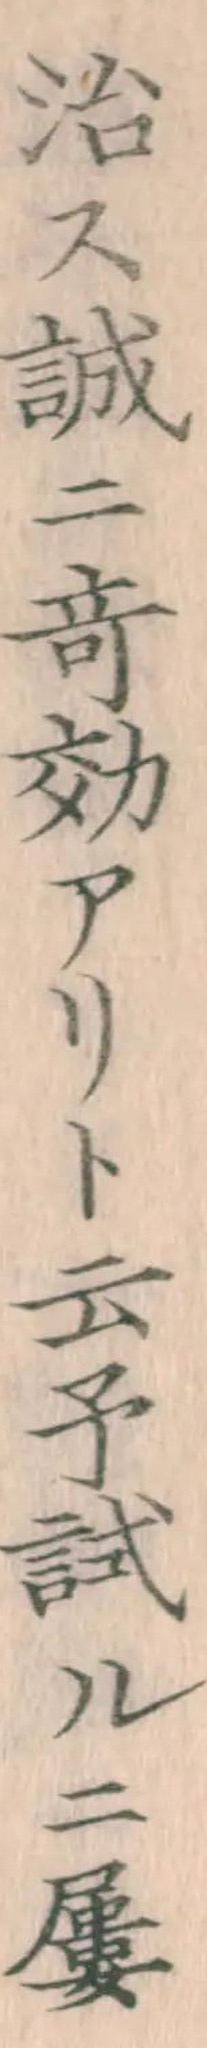治ス誠ニ奇効アリト云予試ルニ屢
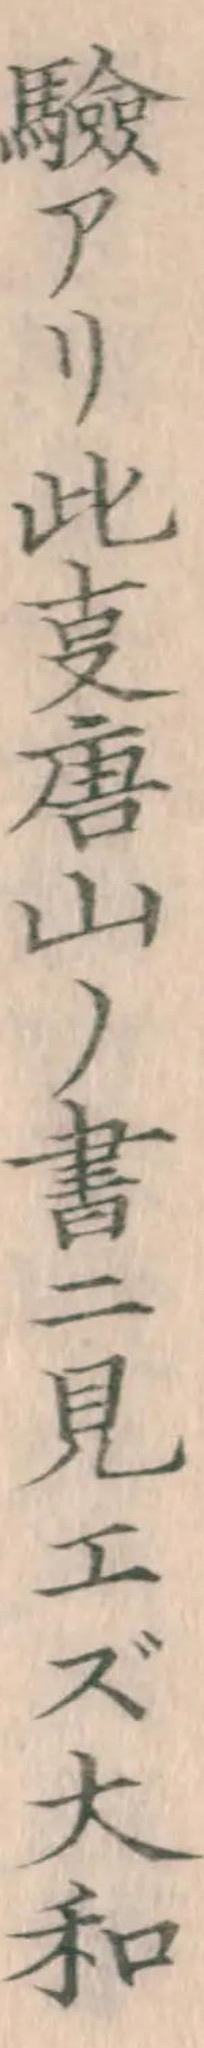験アリ此事唐山ノ書ニ見エズ大和
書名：皇和魚譜 2巻
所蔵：国立国会図書館 National Diet Library, JAPAN
